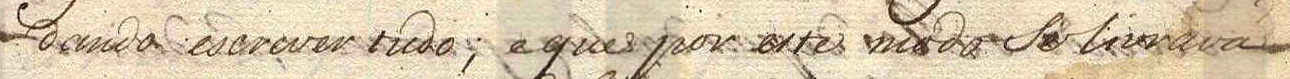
dando escrever tudo; e que por este modo se livravaõ
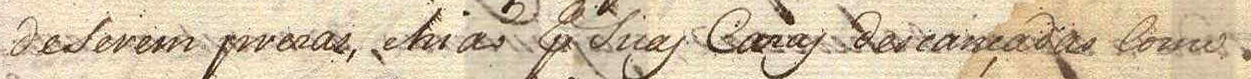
de serem prezas, e hiaõ pa suas Cazas descançadas como
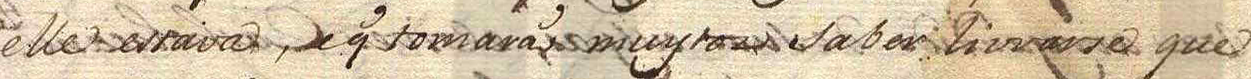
elle estava, e q̄ tomaraõ muytos saber livrarse que
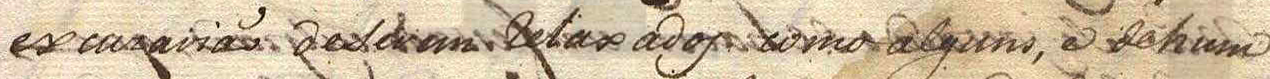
excuzariaõ de serem Relaxados como alguns, e de hum
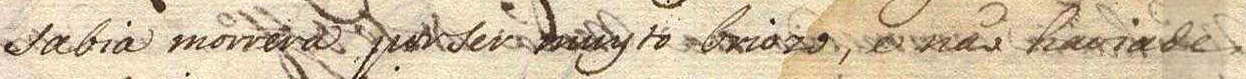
sabia morrera por ser muyto briozo, e não havia de
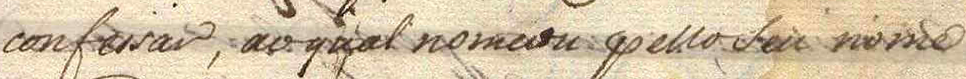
confessar, ao qual nomeou pello seu nome
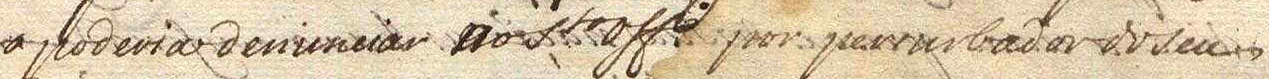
o poderia denunciar no S.to off.o por perturbador do seu
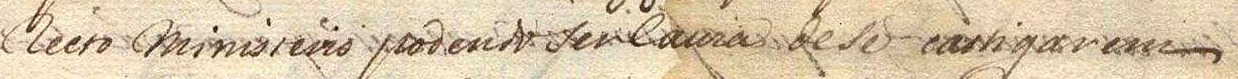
Recto ministerio podendo ser Cauza de se castigarem
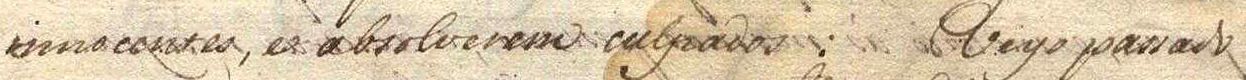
innocentes, e absolverem culpados: Veyo passado
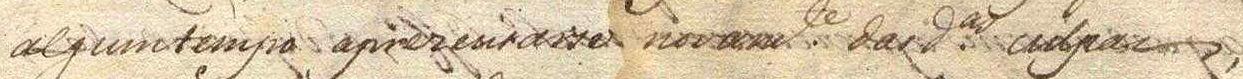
algum tempo aprezentarse novam.te das d.as culpas,
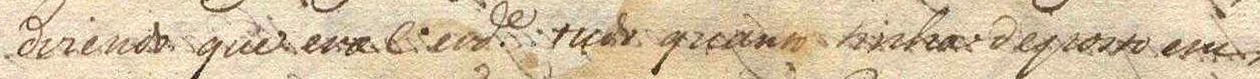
dizendo que era verd.e tudo quanto tinha deposto em
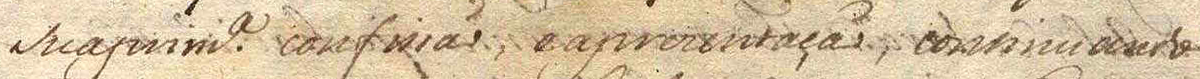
sua prim.a confissão, e aprezentaçaõ, continuando
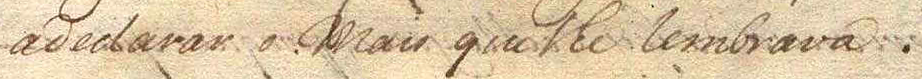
a declarar o Mais que lhe lembrava.
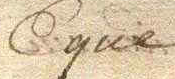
E que
